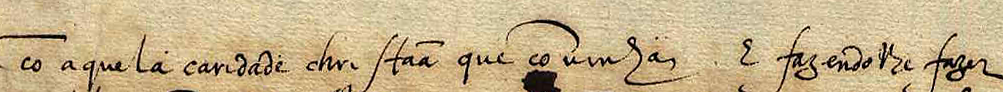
c̄o aquela caridade christaā que c̄ouinha E fazendolhe fazer
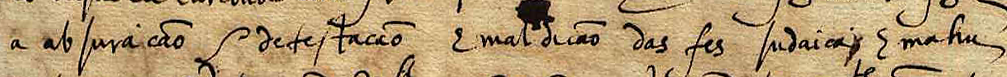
a abJuração e detestação E maldição das fes Judaicas E mahu
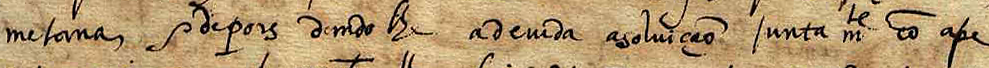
metana, e depois damdo lhe a deuida asoluição Juntamte c̄o a pe
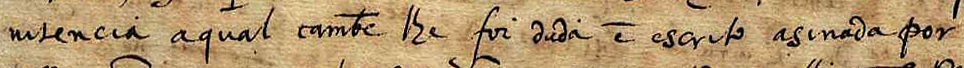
nitencia a qual tambē lhe foi dada ē escrito asinada por
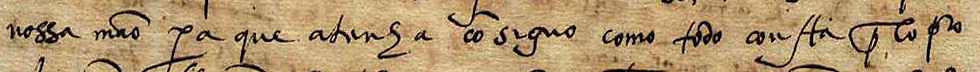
nossa mão ꝑa que a tenha cōsiguo como todo consta p̄lo pro
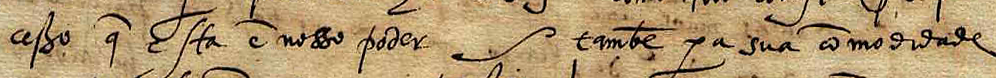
cesso q̄ esta ē nosso poder e tambē ꝑa sua c̄omodidade
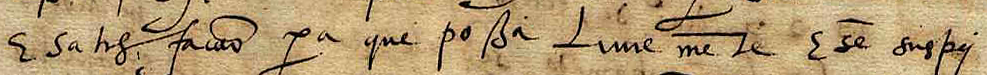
E satisfacão ꝑa que possa Liuremēte E sē suspej
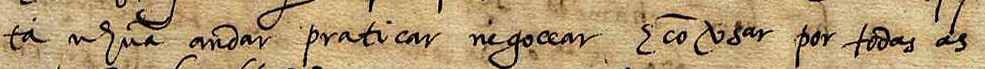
ta nhuā andar praticar negocear E c̄oꝟsar por todas as
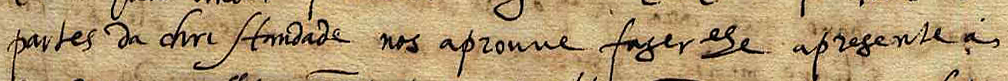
partes da christandade nos aprouue fazerlhe a presente a
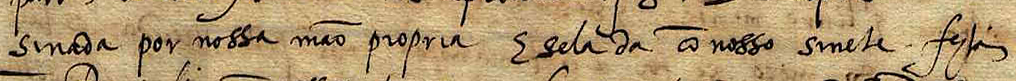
sinada por nossa mão propria E selada c̄o nosso sinete fejta
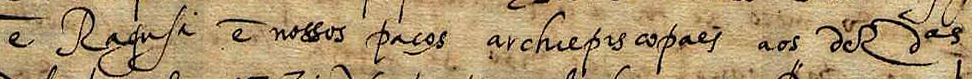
ē Ragusa ē nossos paços archiepiscopaes aos dez das
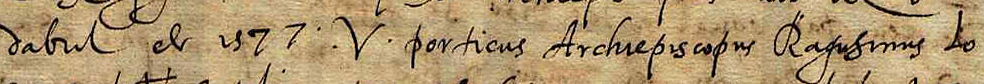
dabril de 1577 .V. porticus Archiepiscopus Ragusinus Lo
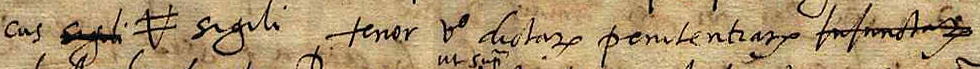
cus sigili V sigili tenor vo dictarꝭ penitentiarꝭ JnJunctarꝭ
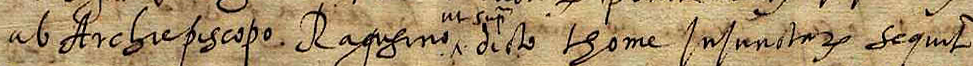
ab Archiepiscopo Ragusino ut sup̄ dicto thome JnJunctarꝭ sequit̄
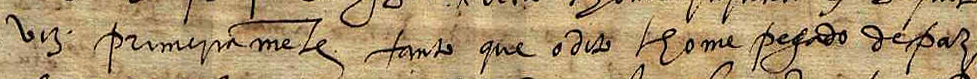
viz. primejramēte tanto que o dito thome pegado de paz
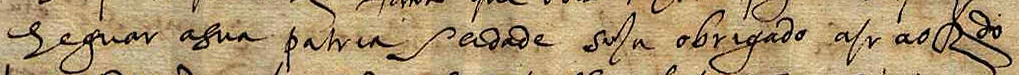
cheguar a sua patria e cidade seJa obrigado a Jr ao Rdo
